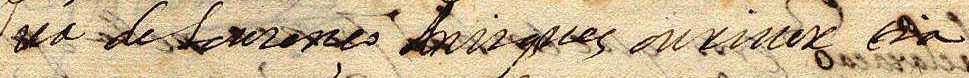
ua de lourenço Anriques ouriuex tia
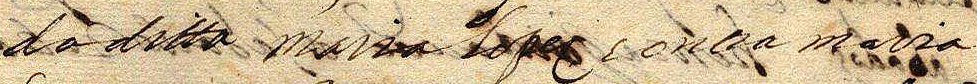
da ditta maria lopez E outra maria
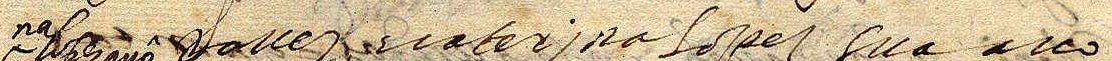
rauez E caterjna Lopez sua auo
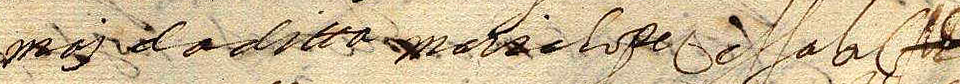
maj da ditta maria lopez e Jsabel frz̄
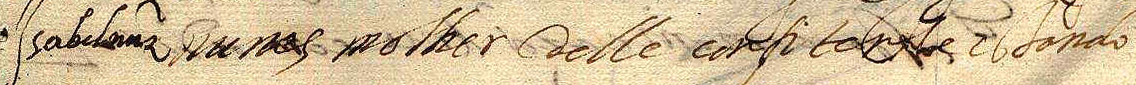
nunes molher delle confitente estando
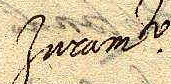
Juramto.
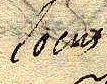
locus
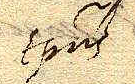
tpūs
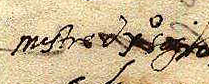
mestre dyo sogro
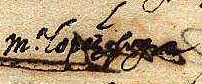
m.a lopes sogra
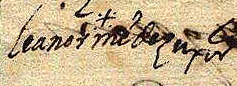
leanor mēdez uxor
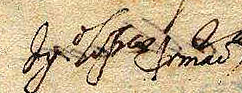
dyo. lopez Irmaõ
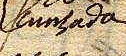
cunhada
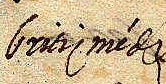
britiz mēdez
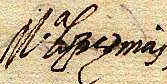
Ma lopez maj
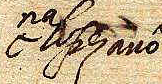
cna lopez auô
